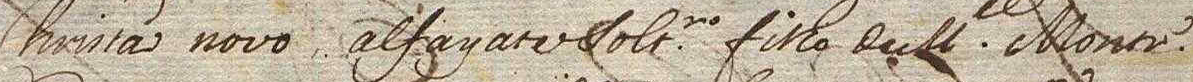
Chistão novo alfayate solt.ro filho de M.el Montr.o
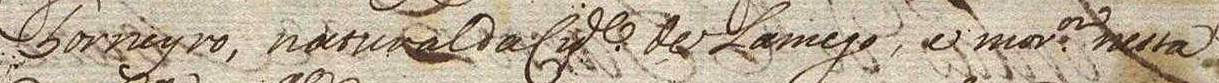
Torneyro, natural da Cid.e de Lamego, e mor.or nesta
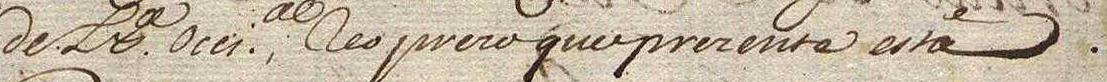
de Lx.a occi.al, Reo prezo que prezente estâ.
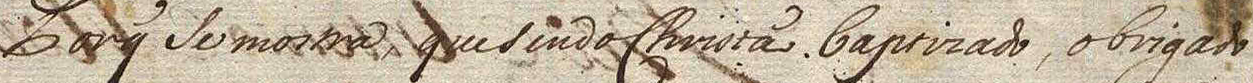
Porq̄ se mostra, que sendo Christão baptizado, obrigado
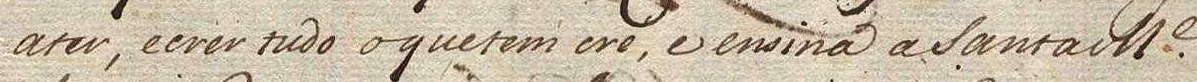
a ter, e crer tudo o que tem cre, e ensina a Santa M.e
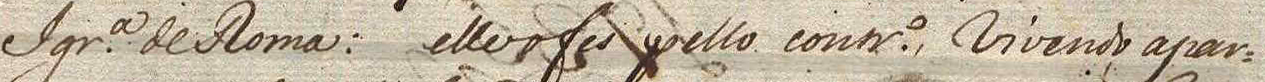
Igr.a de Roma: elle o fes pello contr.o, vivendo apar
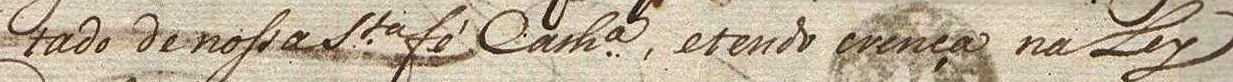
tado de nossa S.ta fé Cath.a, e tendo crença na Ley
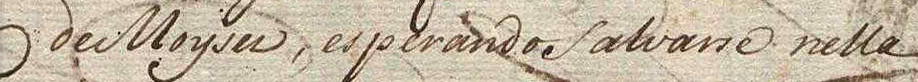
de Moyses, esperando salvarse nella
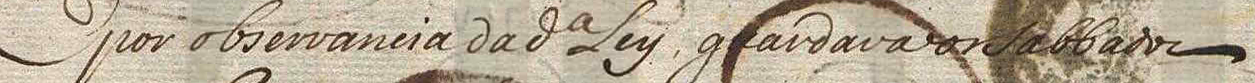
E por observancia da da Ley, guardava os sabbados
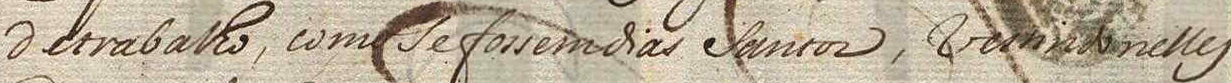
de trabalho, como se fossem dias santos, vestindo nelles
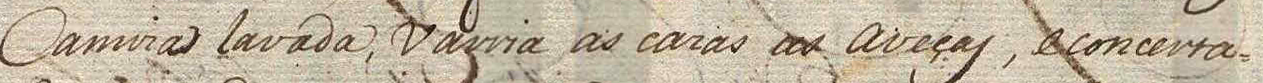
Camiza lavada, varria as cazas as aveças, e concerta
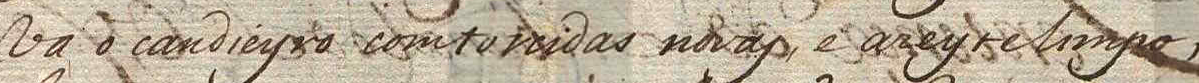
va o candieyro com torcidas novas, e azeyte limpo,
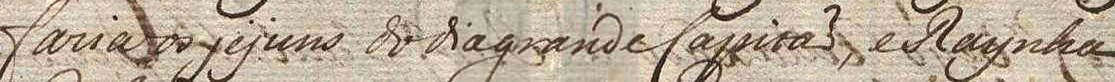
fazia os jejuns do dia grande Capitaõ, e Raynha
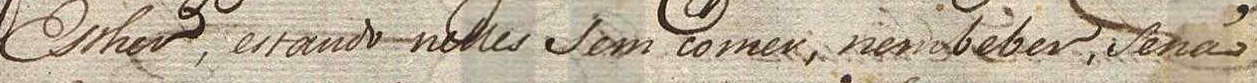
Esther, estando nelles sem comer, nem beber, senaõ
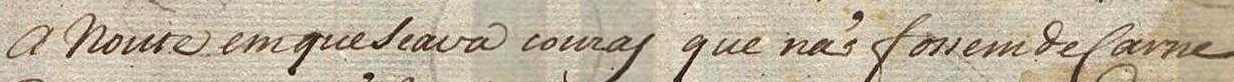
a noute em que seava couzas que naõ fossem de Carne,
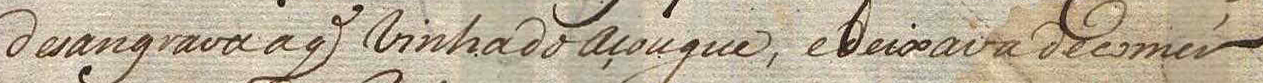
desangrava a q̄ vinha do açougue, e deixava de comer
